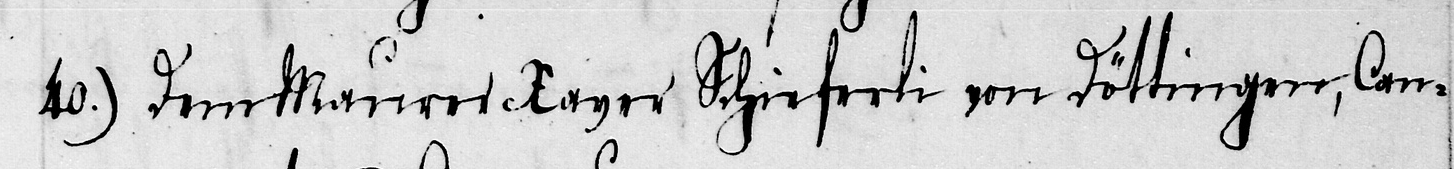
40.) Dem Maurer Xaver Schieferli von Döttingen, Can¬
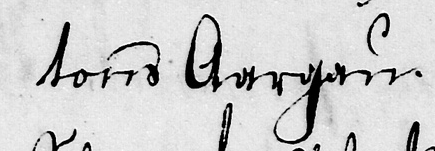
tons Aargau.
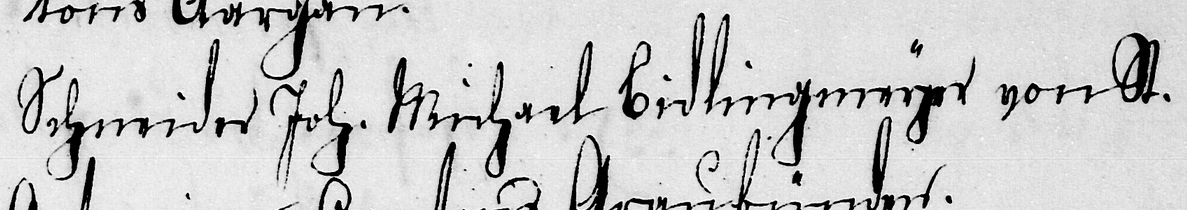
Schneider Joh. Michael Bidlingmeyer von St.
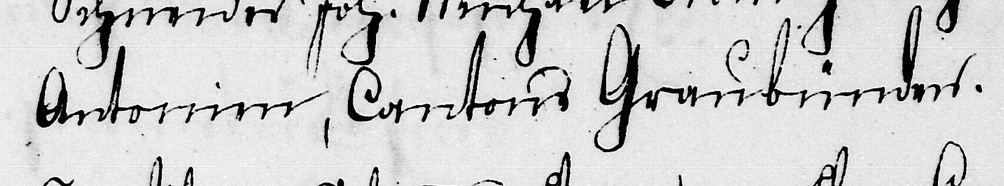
Antonien, Cantons Graubünden.
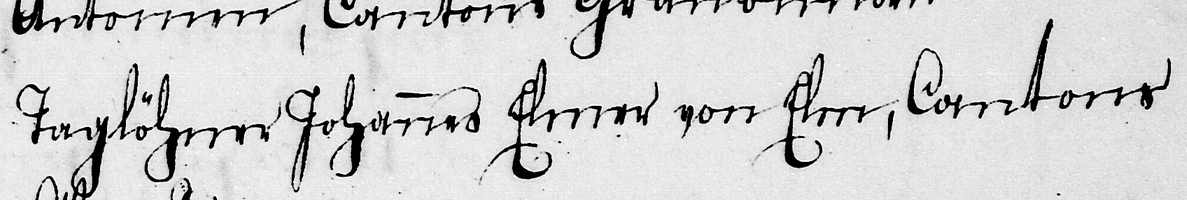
Taglöhner Johannes Elmer von Elm, Cantons
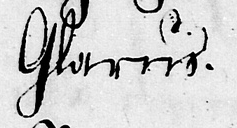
Glarus.
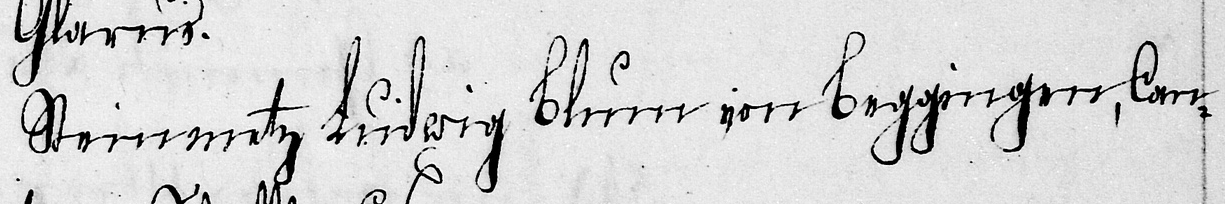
Steinmetz Ludwig Blum von Beggingen, Can¬
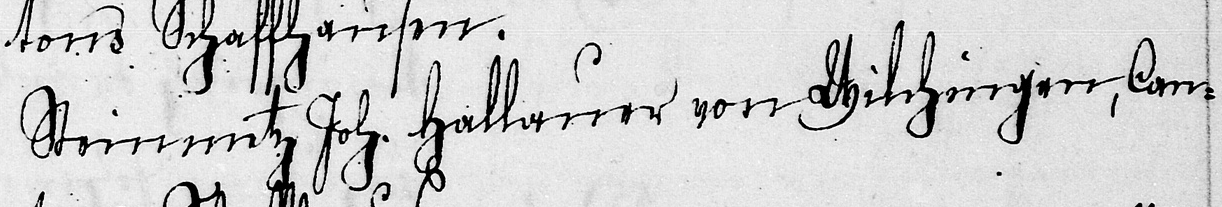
Steinmetz Joh. Hallauer von Wilchingen, Can¬
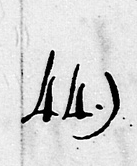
44.)
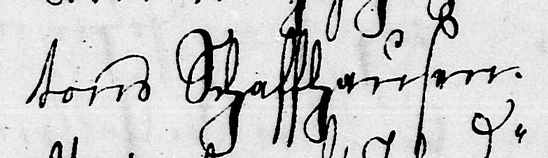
tons Schaffhausen.
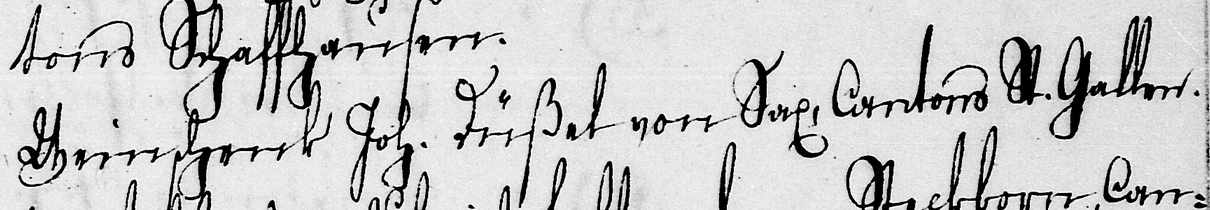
Weinschenk Joh. Düßel von Sax, Cantons St. Gallen.
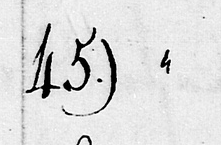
45.) “
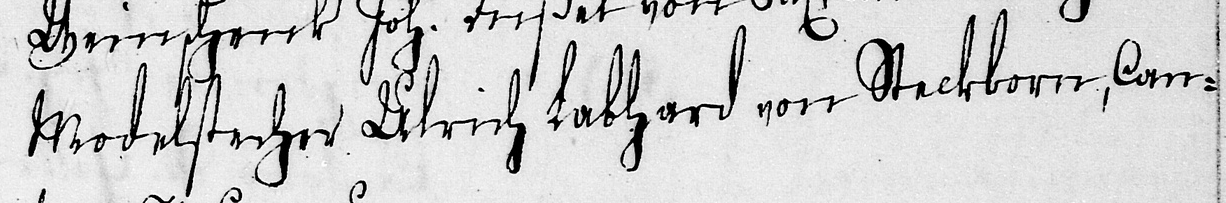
Modelstecher Ulrich Labhard von Steckborn, Can¬
